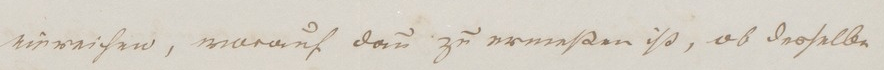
einreichen, worauf dann zu ermeßen ist, ob derselbe
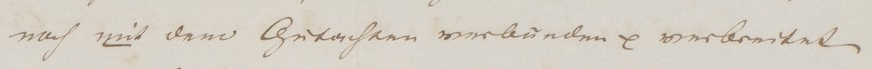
noch mit dem Gutachten verbunden & verbreitet
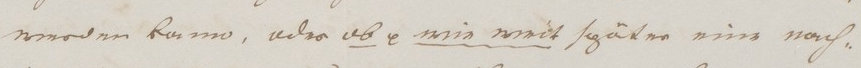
werden kann, oder ob & wie weit später eine nach-
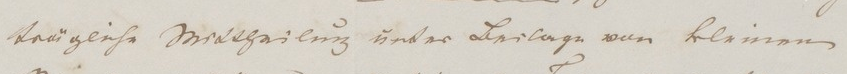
trägliche Mittheilung unter Beilage von kleinen
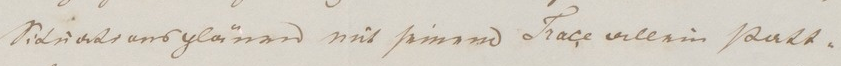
Situationsplänen mit seinem Traçe allein statt-
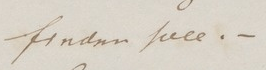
finden soll. –
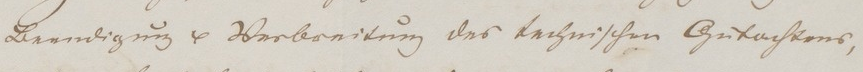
Beendigung & Verbreitung des technischen Gutachtens,
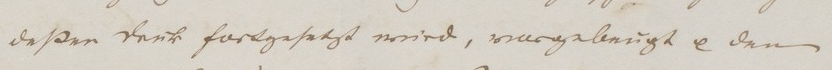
deßen Druk fortgesetzt wird, vorgebeugt & den
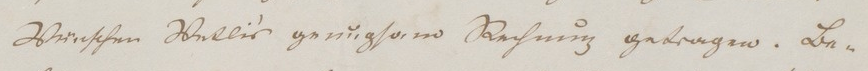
Wünschen Wetli's genugsam Rechnung getragen. Be-
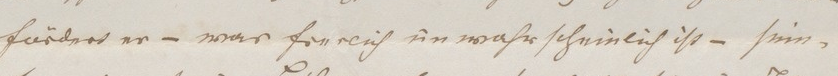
fördert er – was freilich unwahrscheinlich ist – sein
